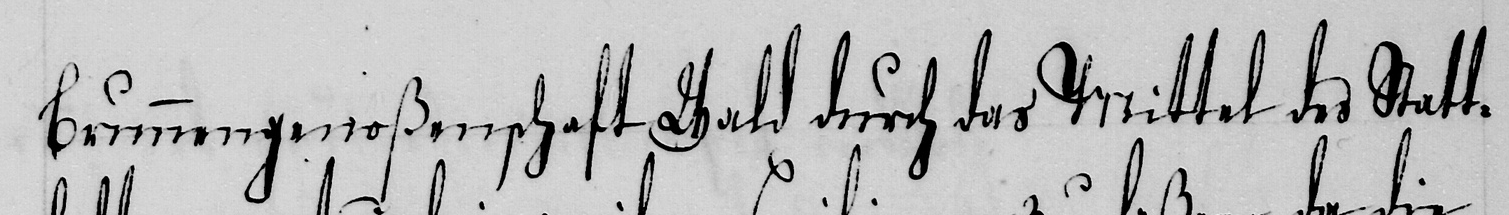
Brunnengenoßenschaft Wald durch das Mittel des Stat¬
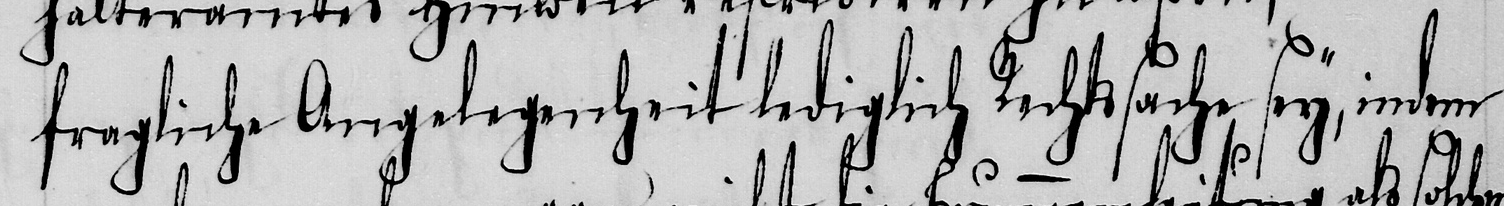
ragliche Angelegenheit lediglich Rechtssache
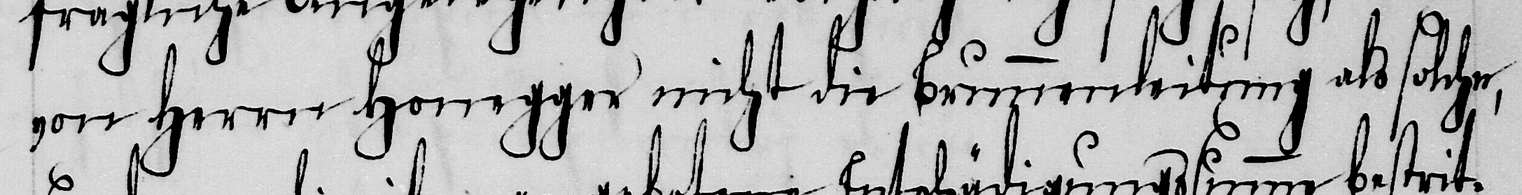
von Herrn Honegger nicht die Brunnenleitung als solche,
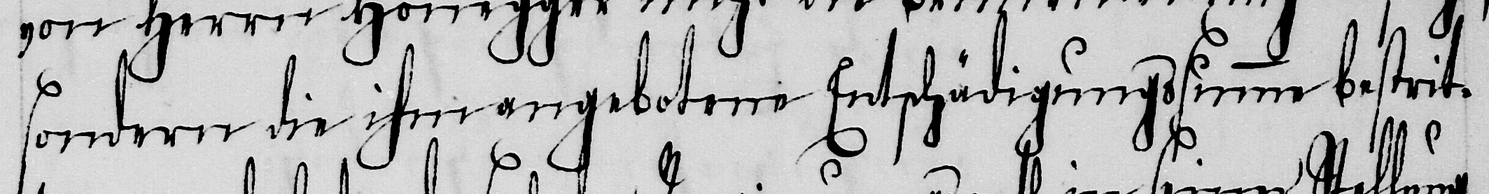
sondern die ihm angebotene Entschädigungssumme bestrit¬
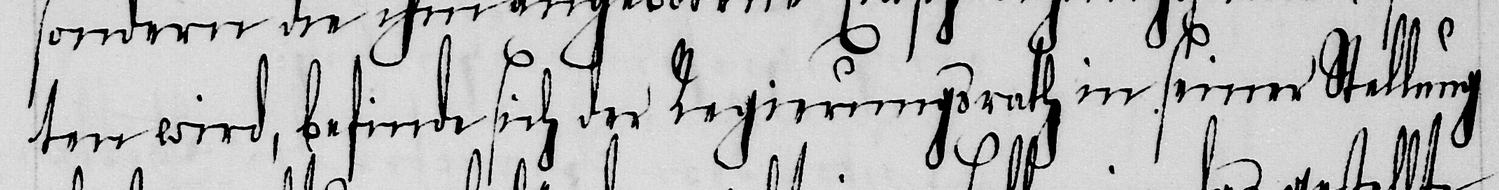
ten wird, befinde sich der Regierungsrath in seiner Stellung
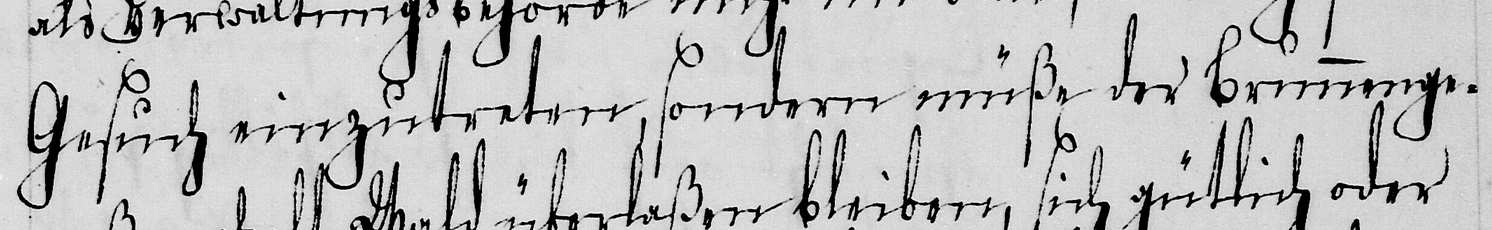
Gesuch einzutreten, sondern müße der Brunnenge¬
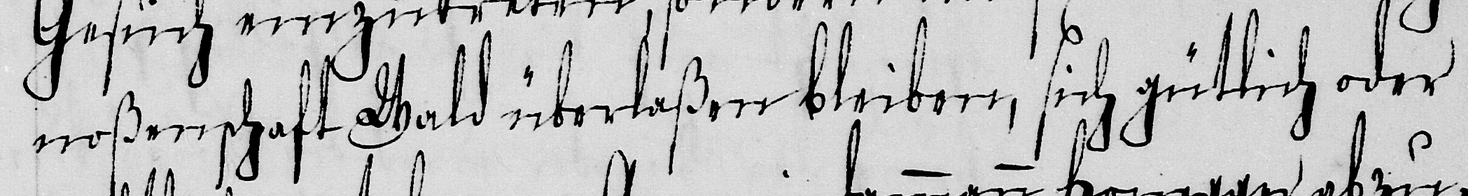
noßenschaft Wald überlaßen bleiben, sich gütlich oder
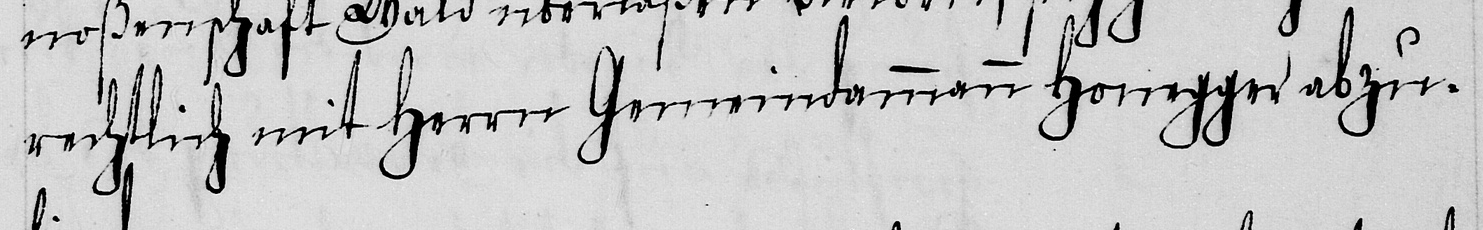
rechtlich mit Herrn Gemeindammann Honegger abzu¬
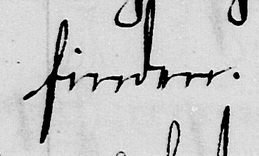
finden.
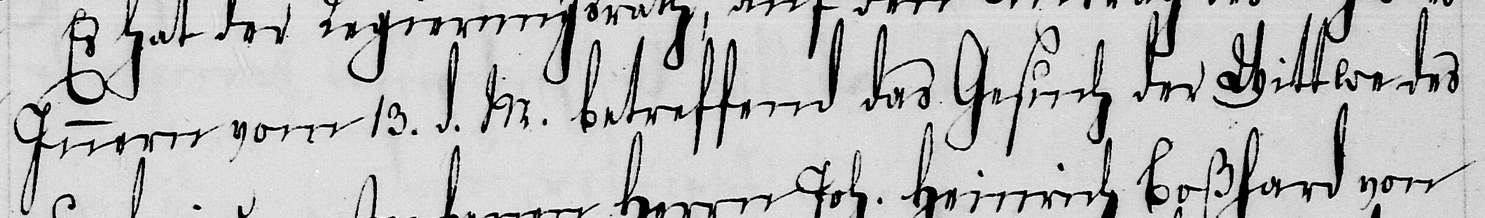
Innern vom 13. d. M. betreffend das Gesuch der Wittwe des
